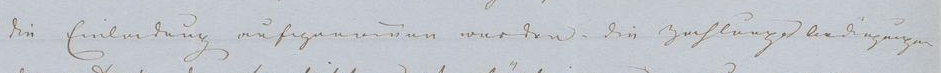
die Einladung aufgenommen werden – die Zahlungsbedingungen
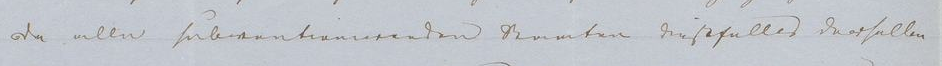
Da alle subventionirenden Staaten dießfalls dasselbe
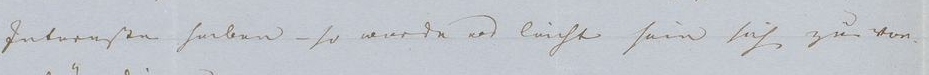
Intereße haben – so werde es leicht sein sich zu ver-
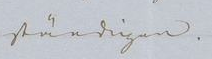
ständigen.
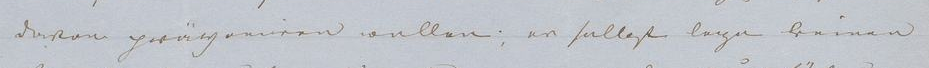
davon präponiren wollen; er selbst lege keinen
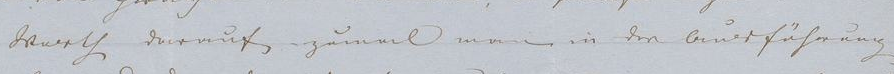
Werth darauf – zumal man in der Ausführung
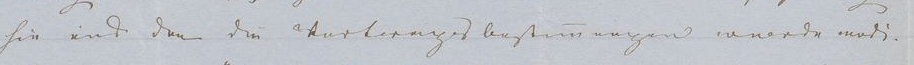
hie und dann die Vertragsbestimmungen werde modi-
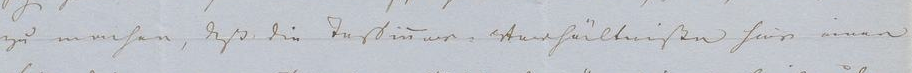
zu machen, daß die Tessinner-Verhältniße hier einen
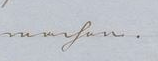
machen.
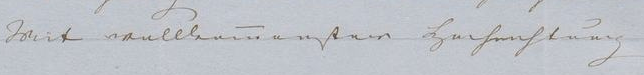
Mit vollkommenster Hochachtung
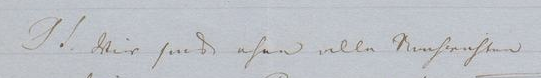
PS. Wir sind ohne alle Nachrichten
